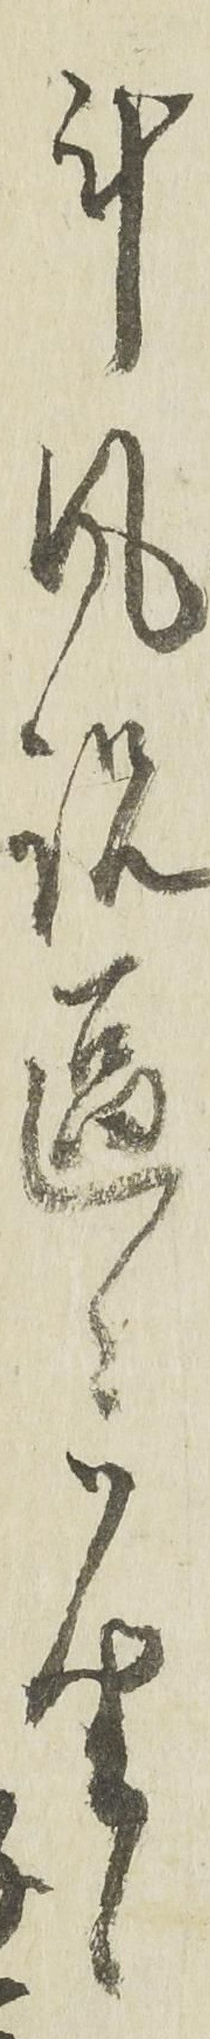計風説区々御坐候
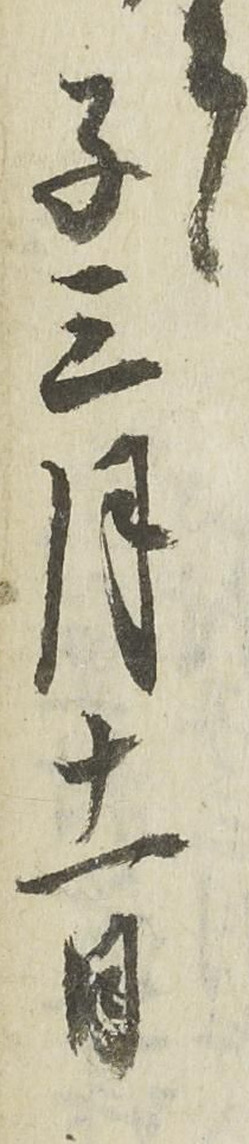子三月十一日

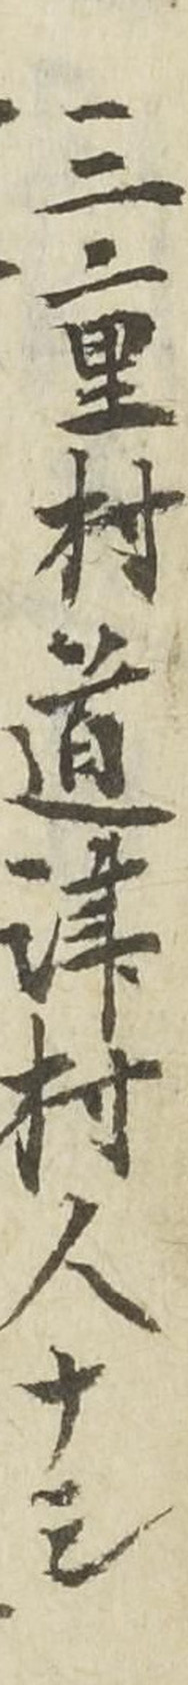三重村道津村人ナシ
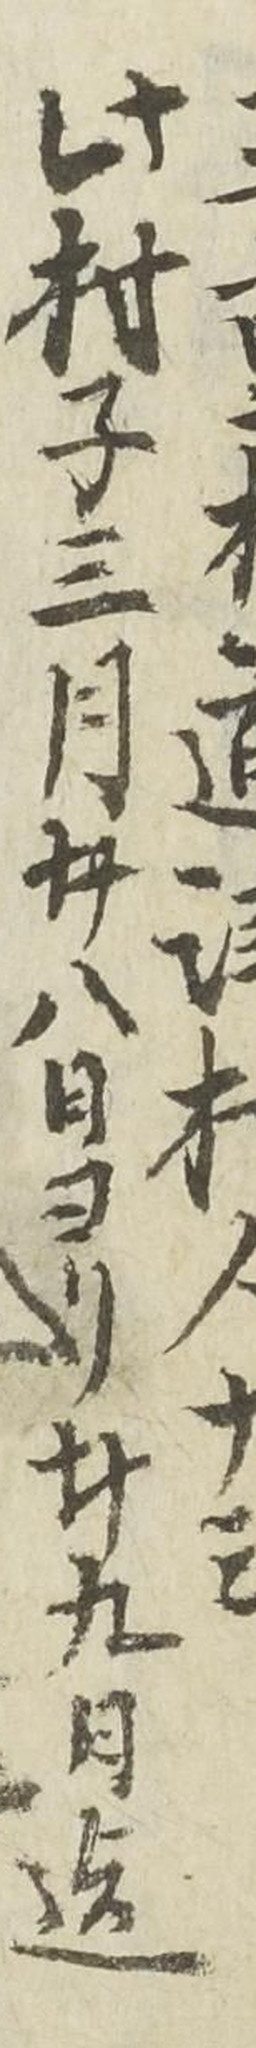此村子三月廿八日ヨリ廿九日迄
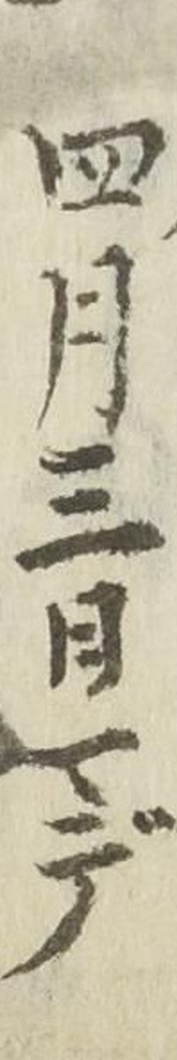四月三日マデ
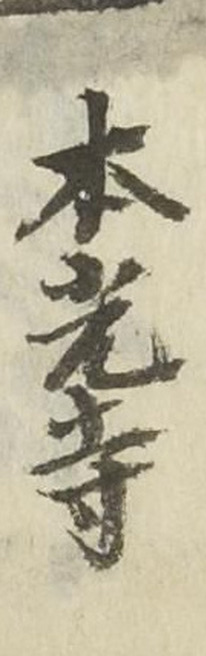本光寺
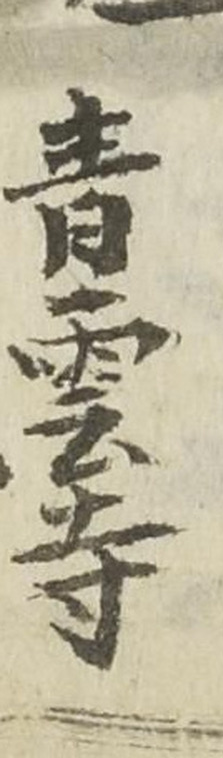青雲寺
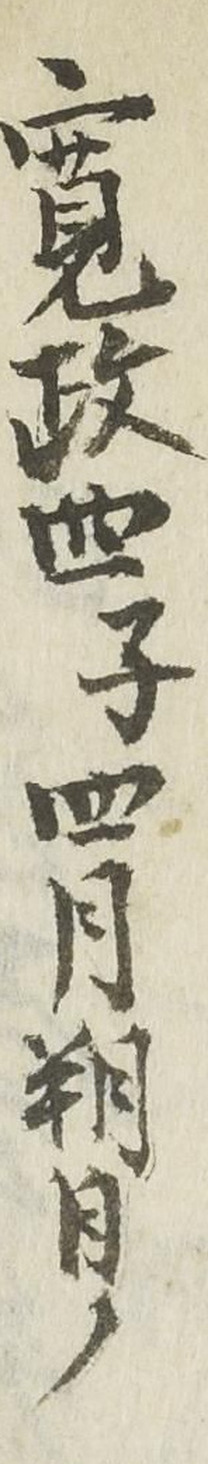寛政四子四月朔日ノ
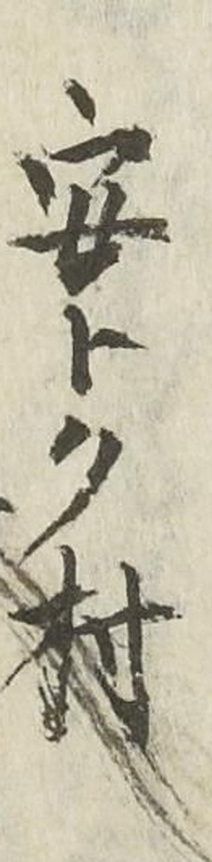安トク村
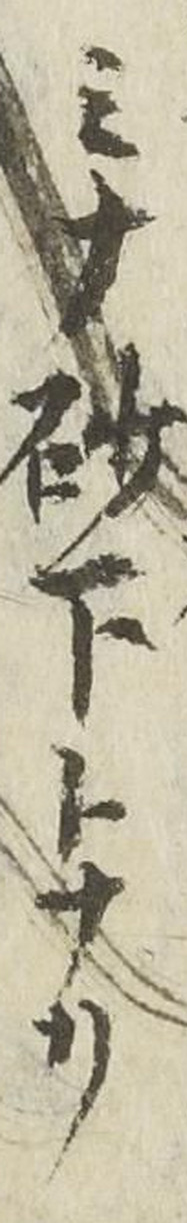ミナ砂下トナリ
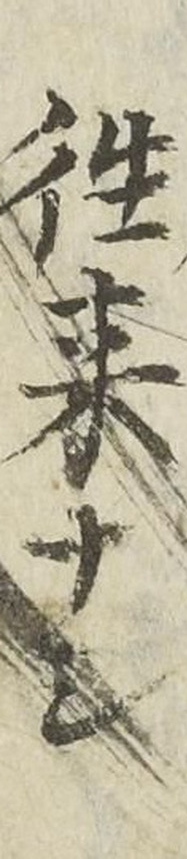往来ナシ

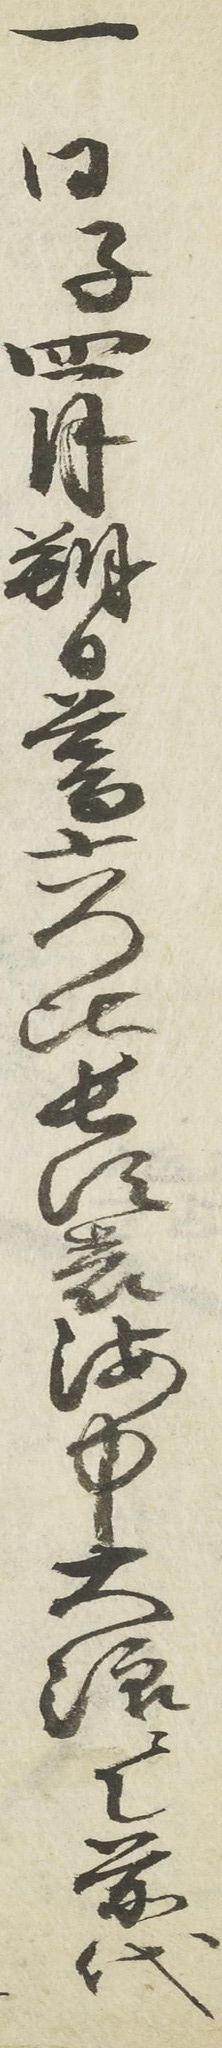一同子四月朔日暮六つ比長洲表海中大浪ニて前代
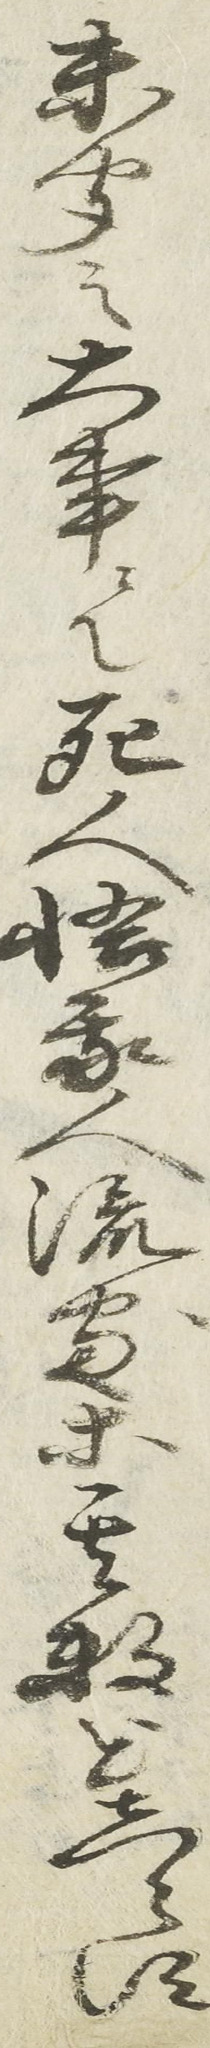未聞の大事ニて死人怪我人流家等其数をしらす
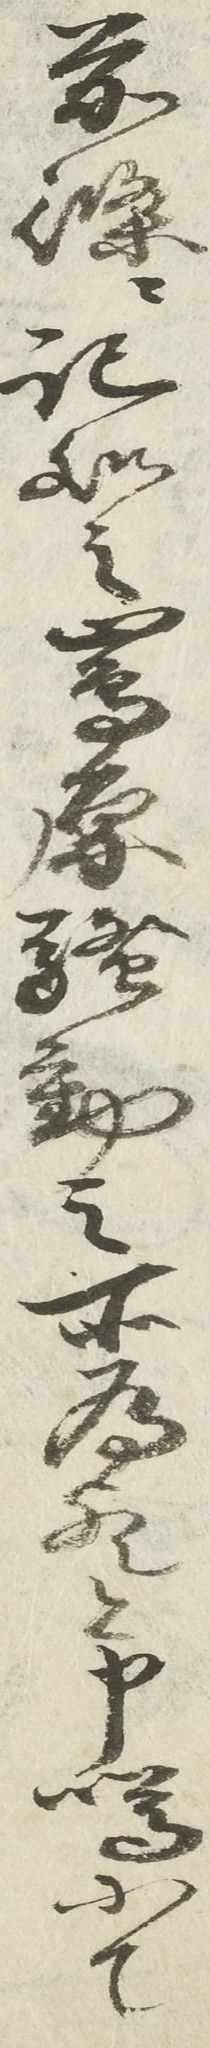前条ニ記処の嶋原騒動之所為歟と申噂にて
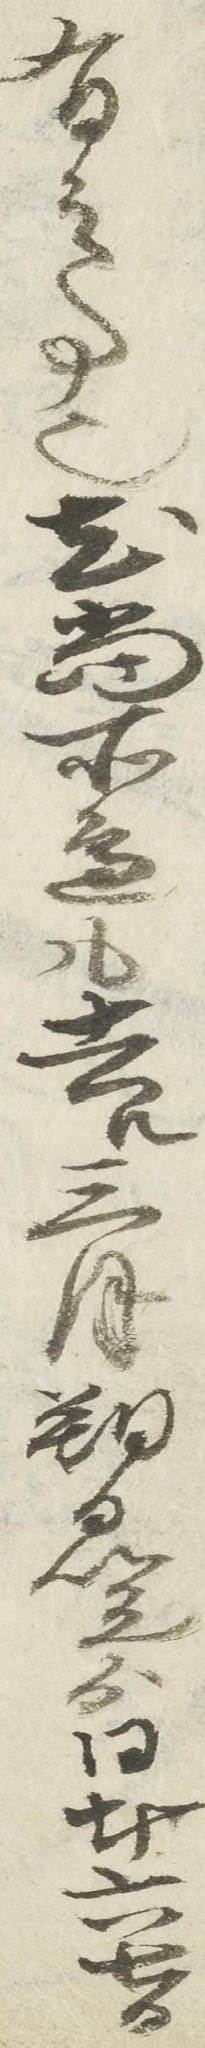有之事也尤当所辺も去ル三月朔日暁ゟ同廿六七日
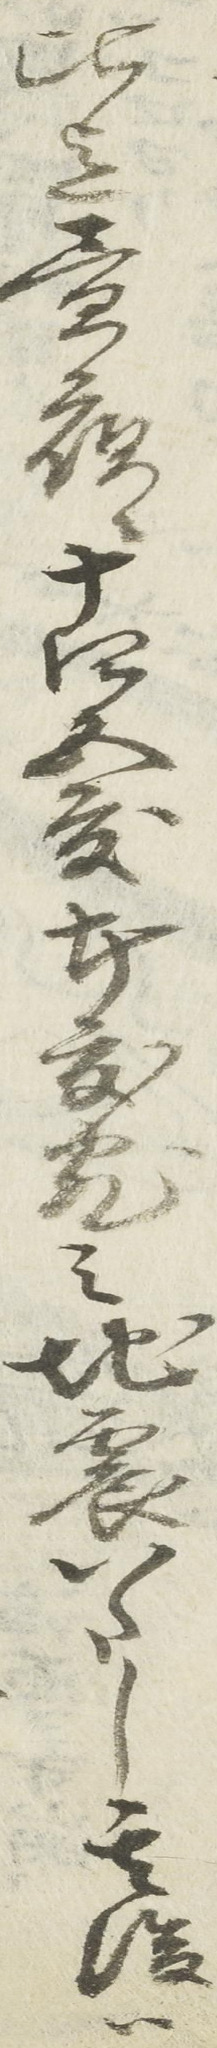比迄昼夜ニ十四五度廿度宛之地震いたし其後は
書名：後見笑
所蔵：東京大学地震研究所図書室 Earthquake Research Institute Library, The University of Tokyo, JAPAN
